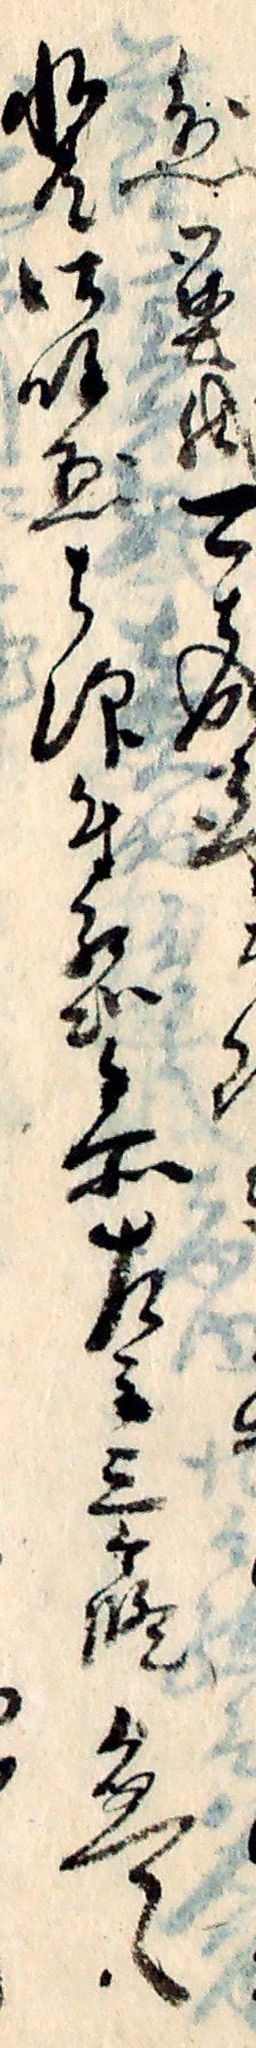私共御呼懸被仰付罷出候所左之三ヶ条急々
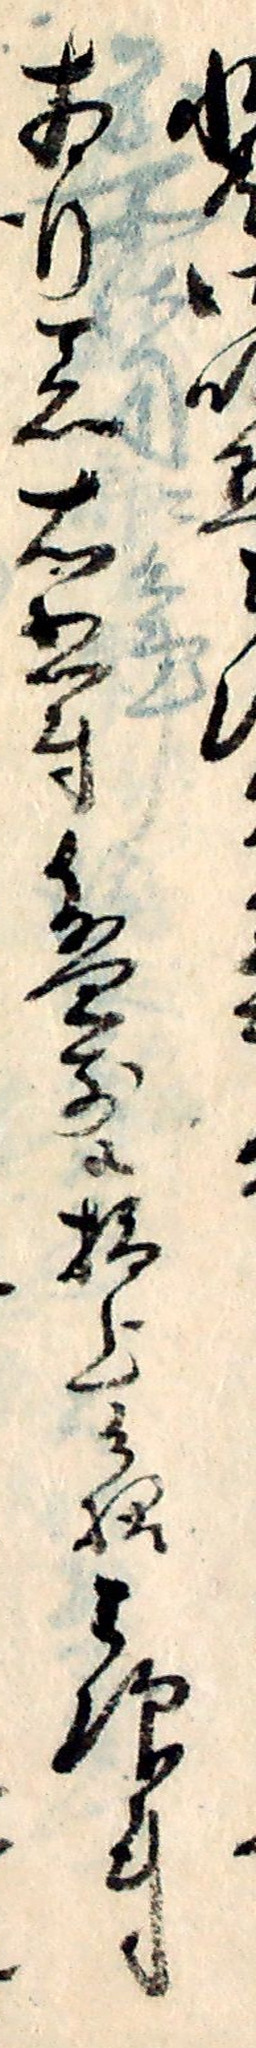相行着右書付盆前に指上候様被仰付
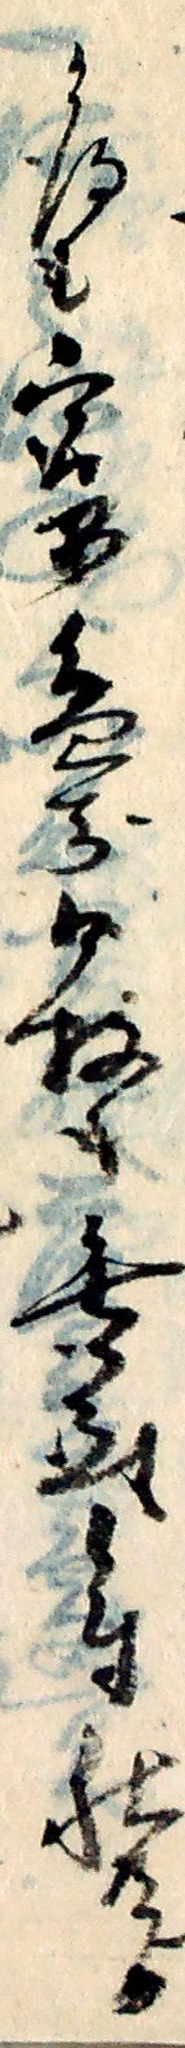候得とも最早盆前日数も無御座候付私共ゟ
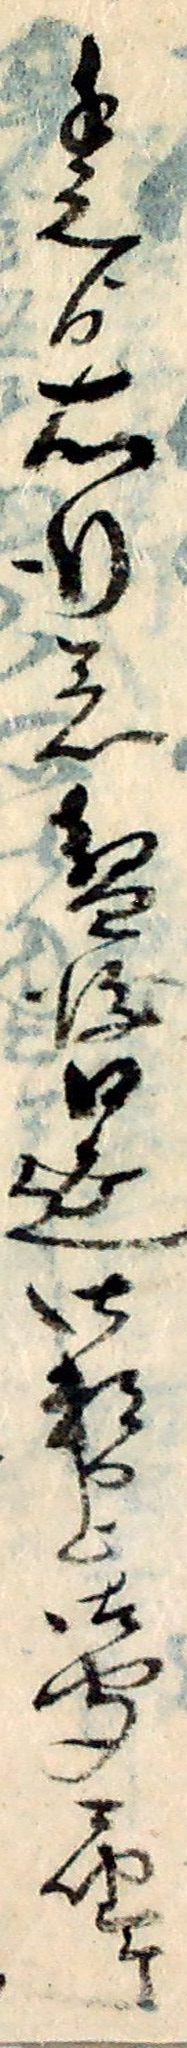手元ゟ右行着盆後日延御願申上御聞届け
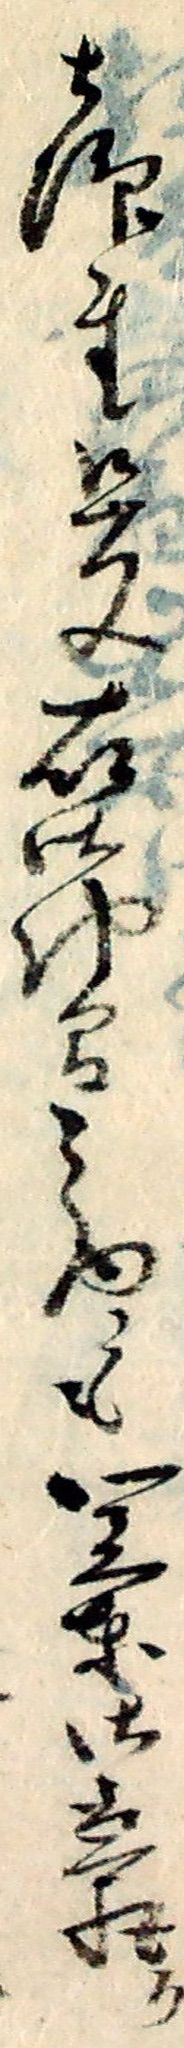被仰付候処右御仲間之内にも関東御取究り
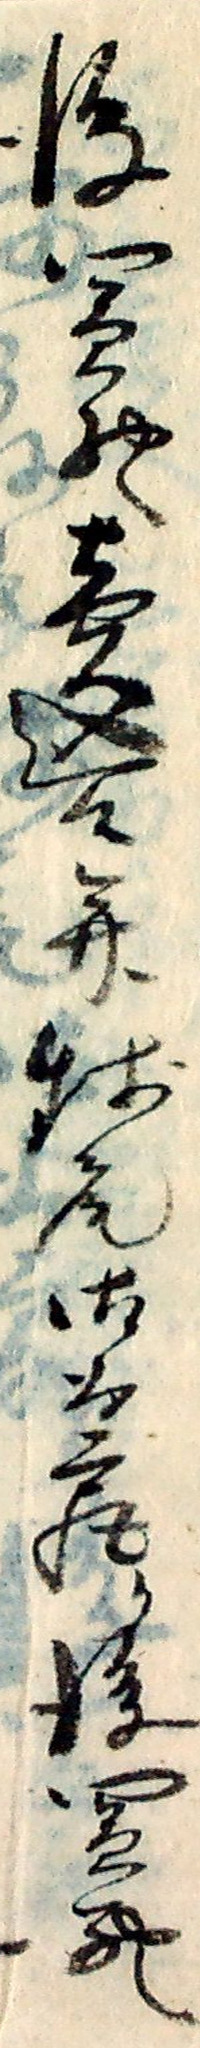後関西へ売込候并残尻御取究り後関西へ
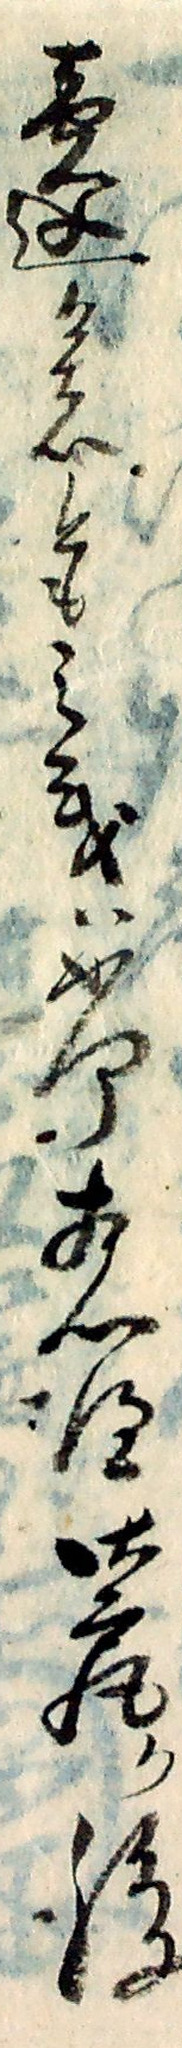売込候者とも之義は如何相心得御究り後
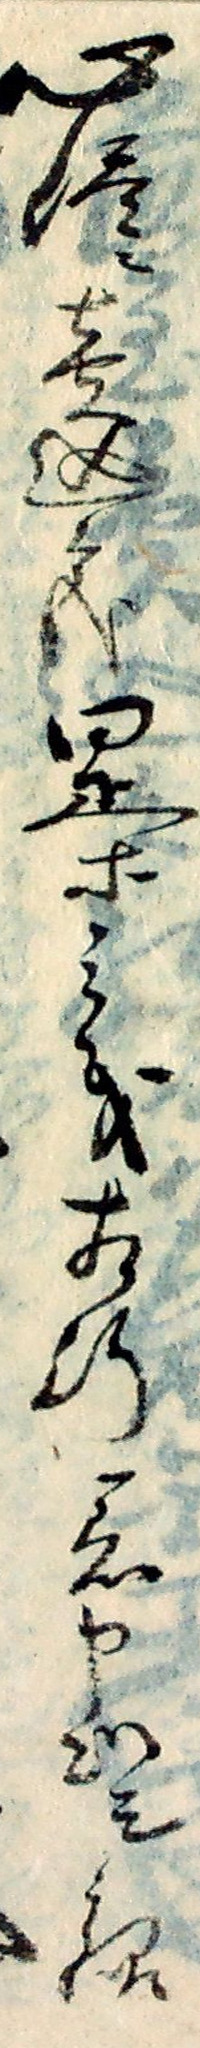心侭に売込候哉是等之義相行着申出し候様
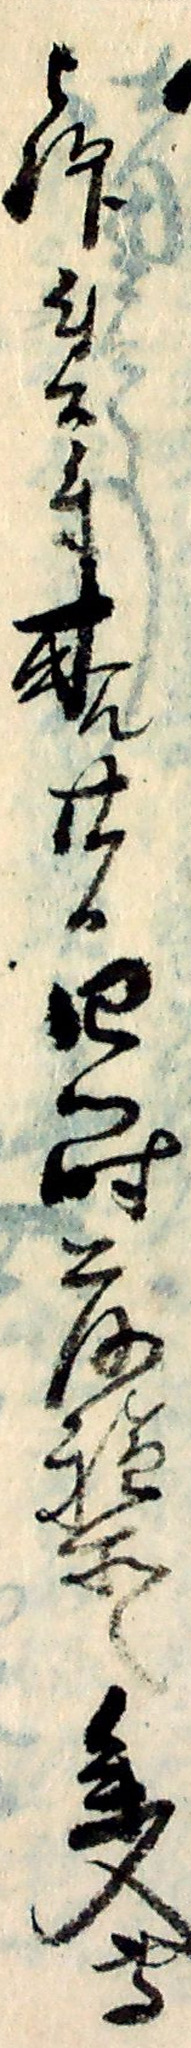被仰付候に付来る廿日四つ時荷積所へ参会
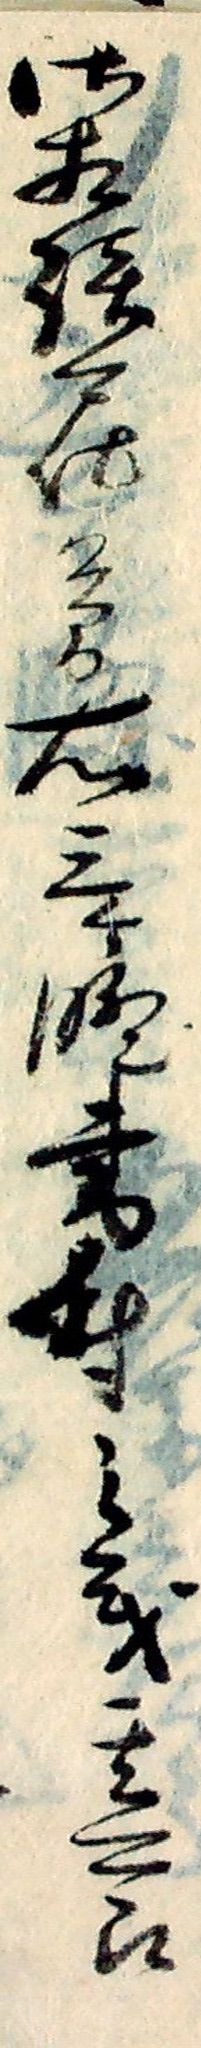御相談可仕候間右三ヶ条書付之義其節
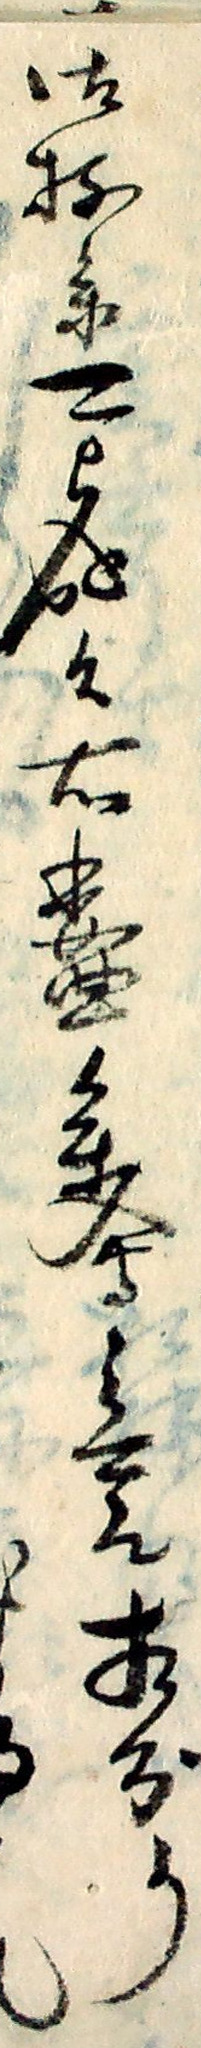御持参可被成候右委曲参会之節相分り
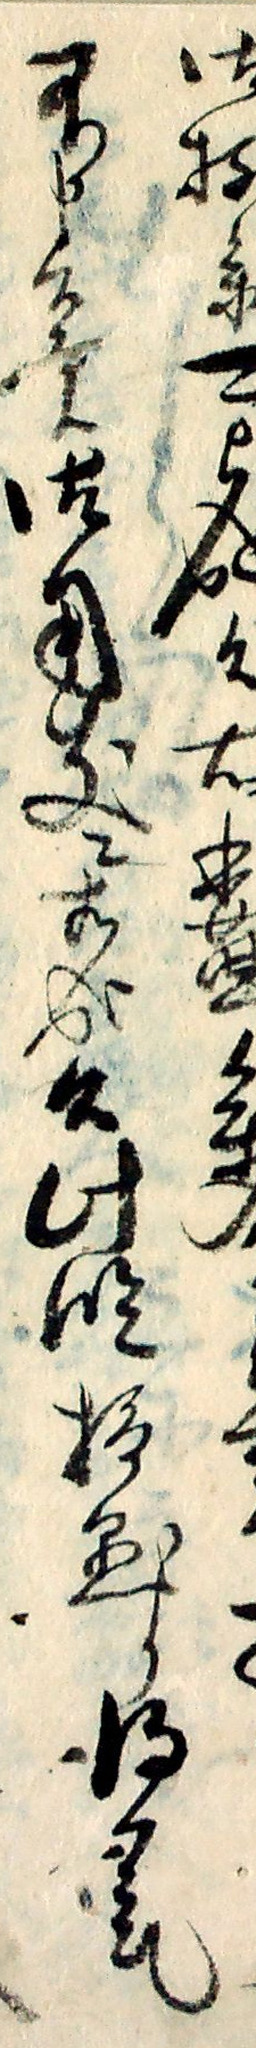不申候ては御用支に相成候此段指懸り得御意
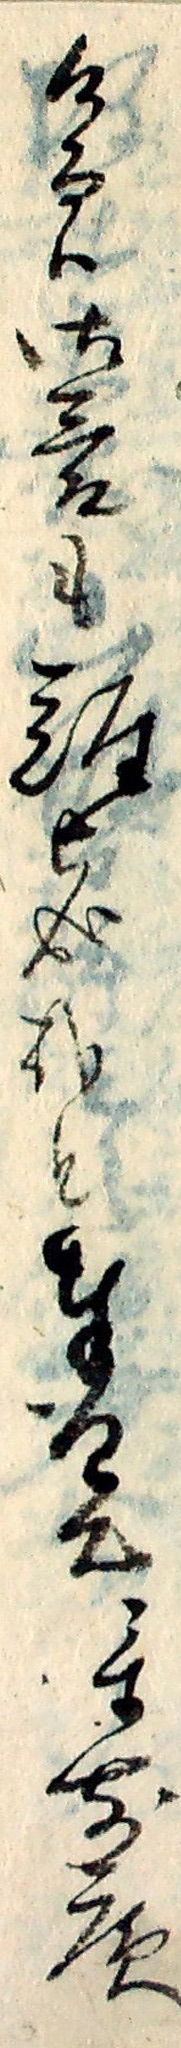候ては御答も難被成哉と奉存候に付前広
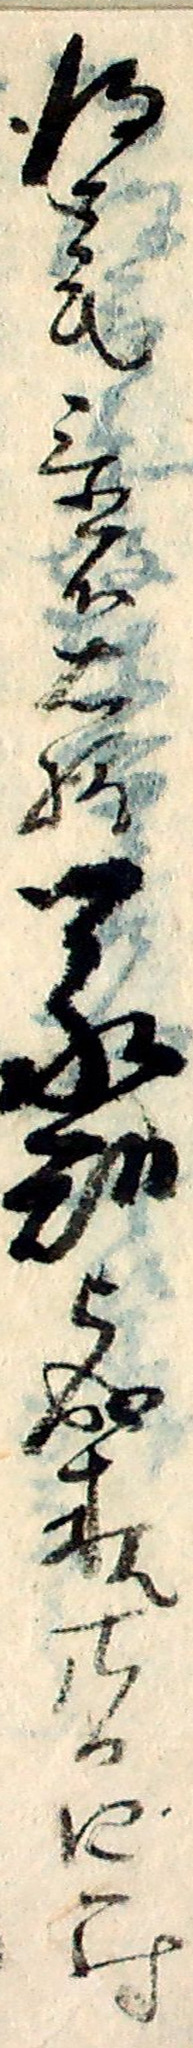得御意置候右様承知被成来る廿日四つ時
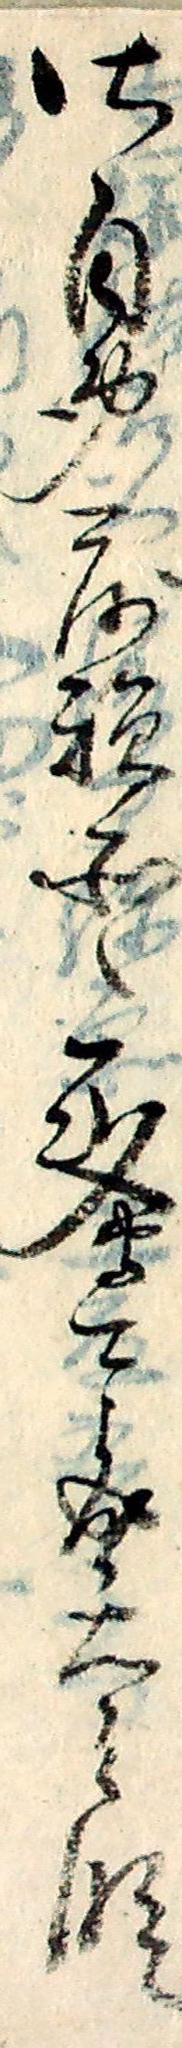御自身荷積所へ御出会可被成候右之段

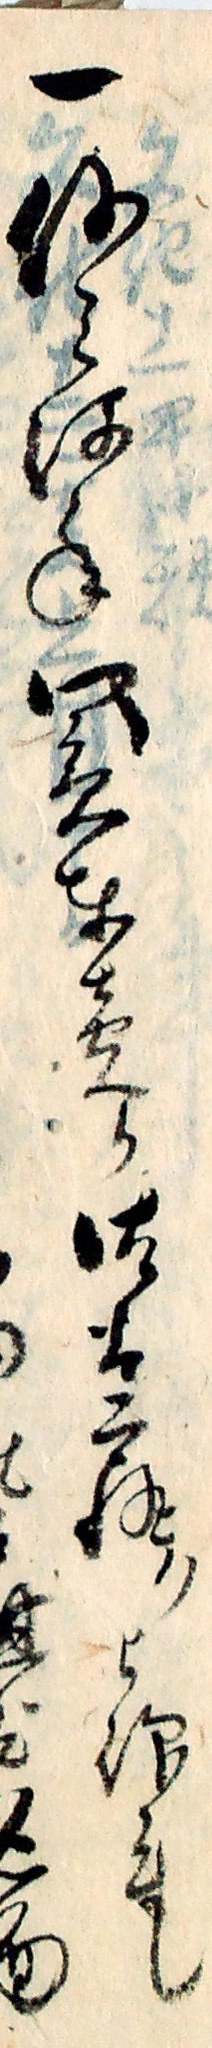一何之何年関東売り御取究り被仰付候
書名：諸御願書控(後藤氏壱番）
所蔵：鳴門教育大学 Naruto University of Education
